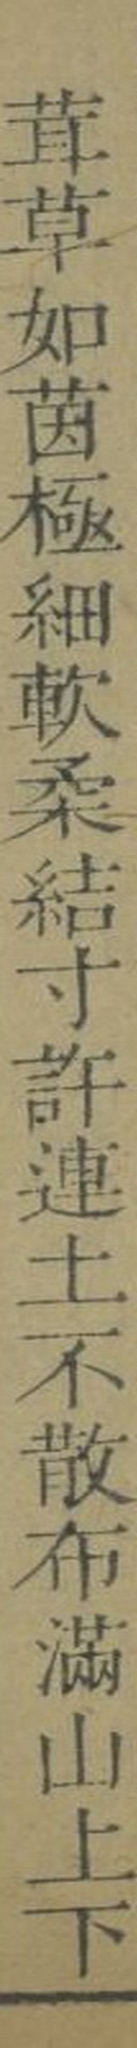茸草如茵極細軟柔結寸許連土不散布満山上下
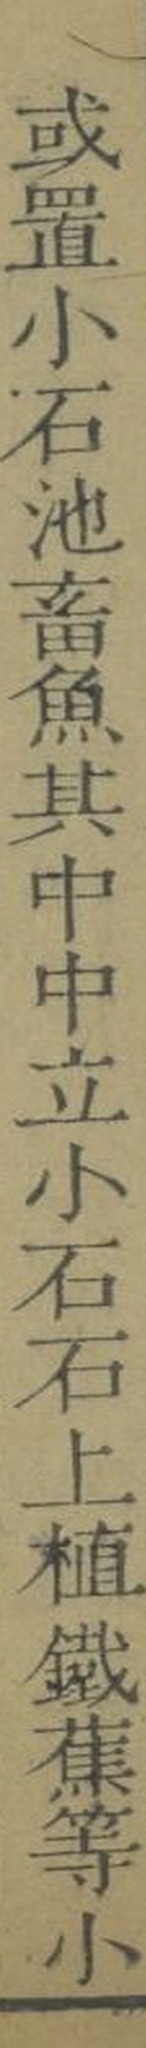或置小石池畜魚其中中立小石石上植鉄蕉等小
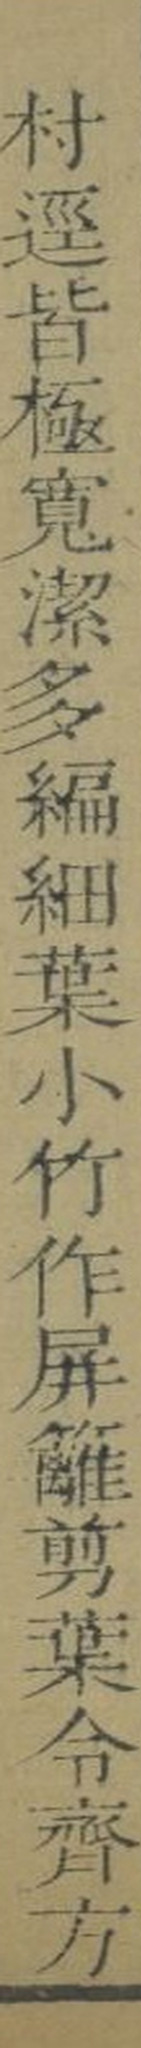村逕皆極寛潔多編細葉小竹作屛籬剪葉令斉方
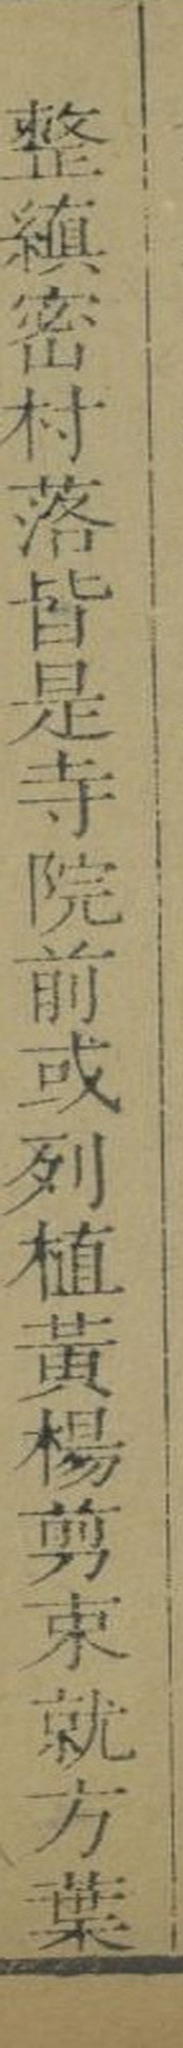整縝密村落皆是寺院前或列植黄楊剪束就方葉
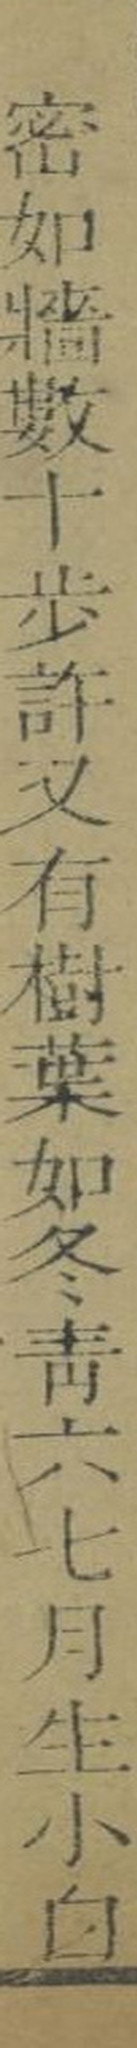密如牆数十歩許又有樹葉如冬青六七月生小白
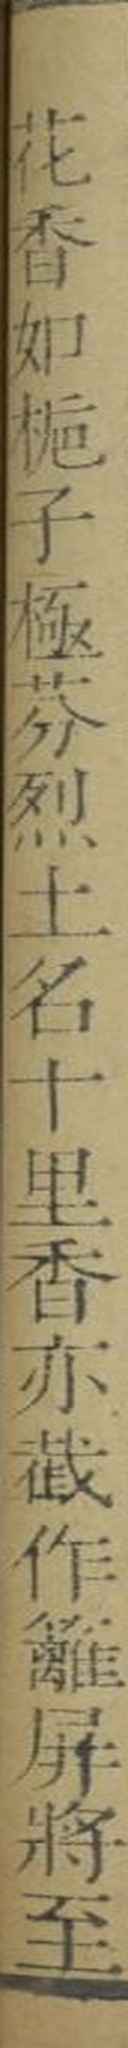花香如梔子極芬烈土名十里香亦截作籬屛将至
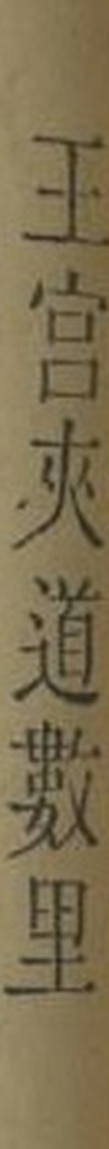王宮夾道数里
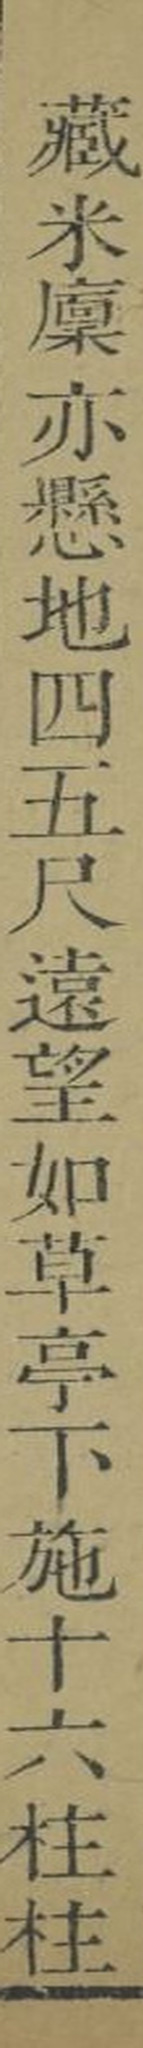蔵米廩亦懸地四五尺遠望如草亭下施十六柱柱
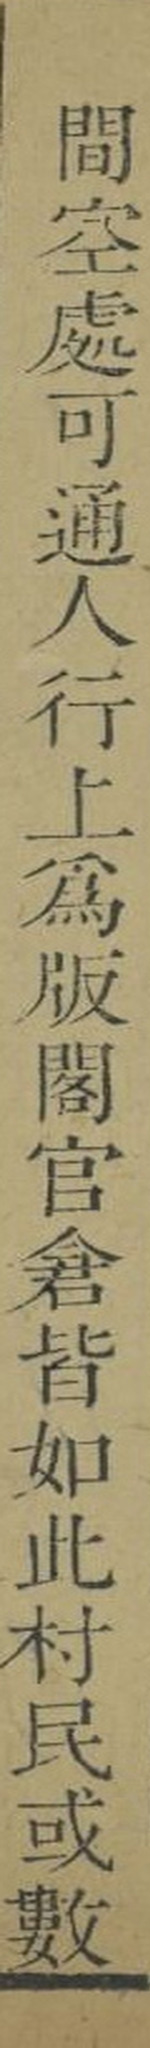間空処可通人行上為版閣官倉皆如此村民或数
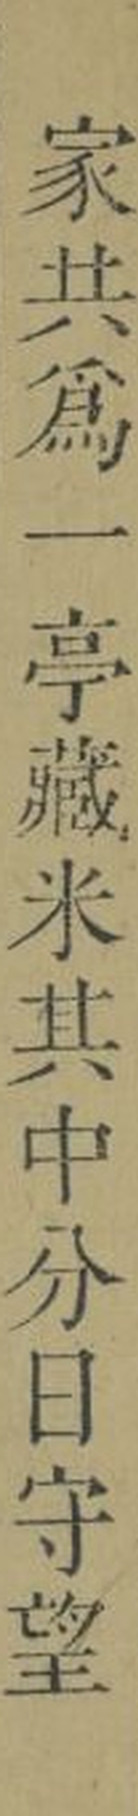家共為一亭蔵米其中分日守望

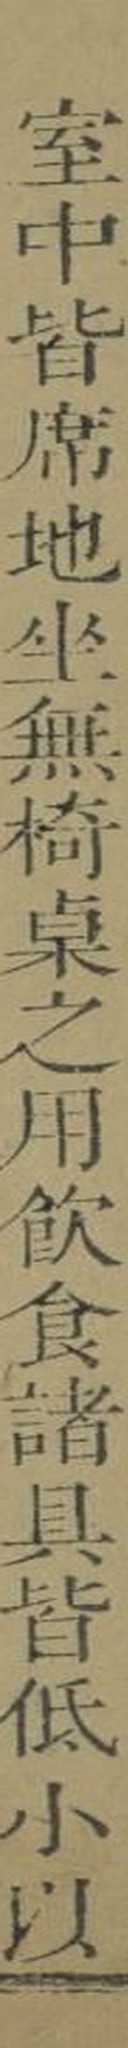室中皆席地坐無椅桌之用飲食諸具皆低小以
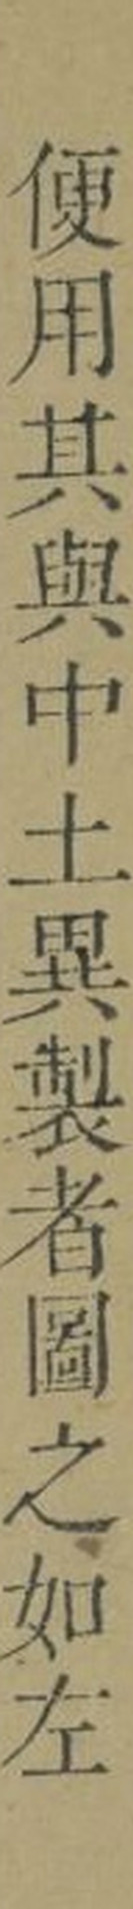便用其与中土異製者図之如左
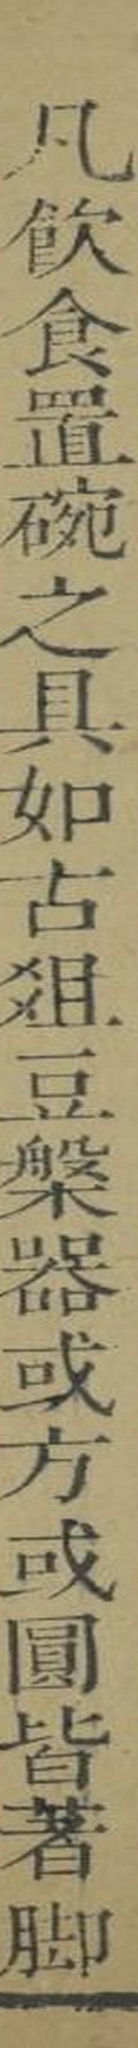凡飲食置碗之具如古俎豆槃器或方或円皆著脚
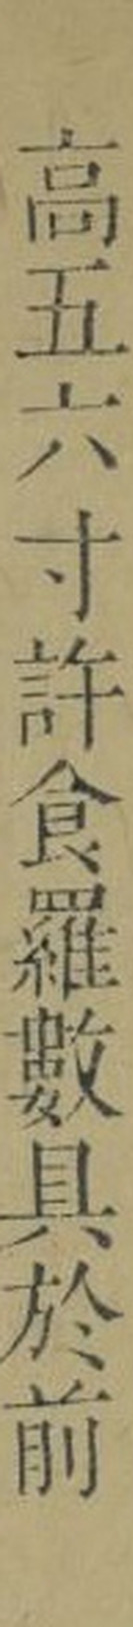高五六寸許食羅数具於前
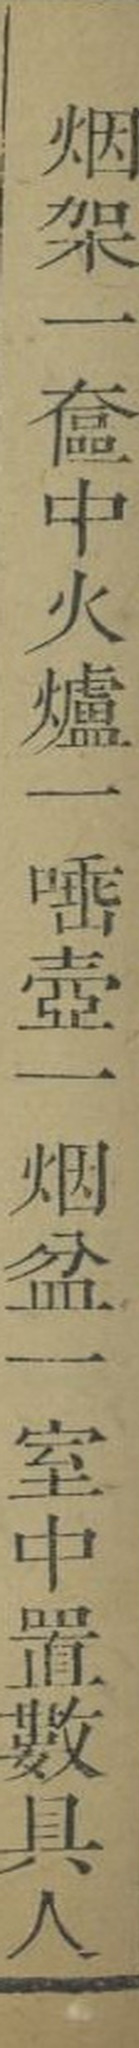煙架一奩中火炉一唾壺一煙盆一室中置数具人
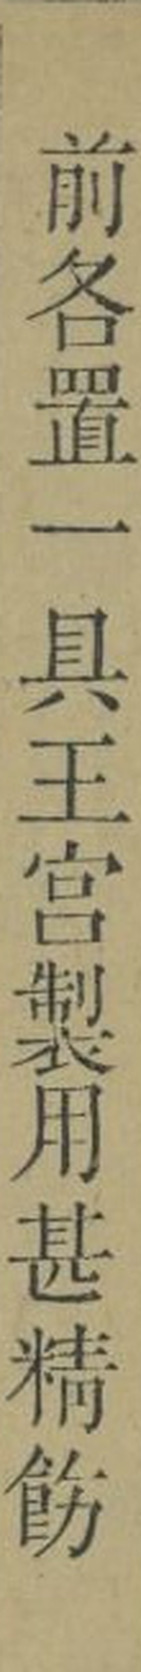前各置一具王宮製用甚精飭
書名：中山伝信録 巻六
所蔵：University of the Ryukyus Library
